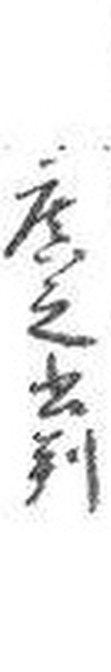広之書判
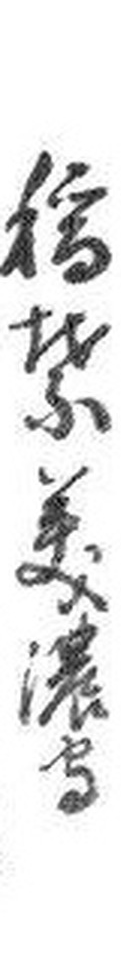稲葉美濃守
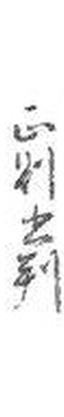正則書判
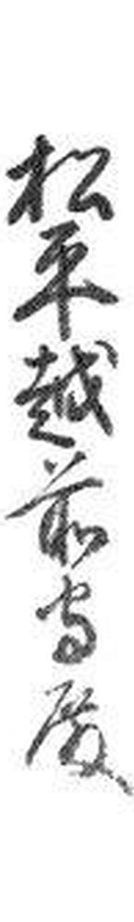松平越前守殿
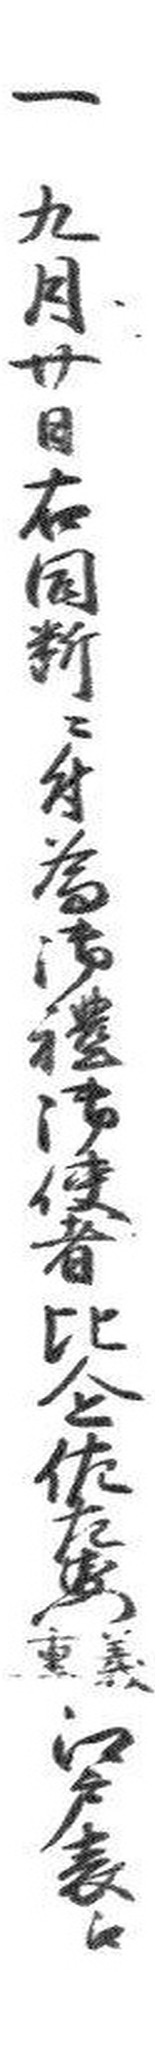一九月廿日右同断ニ付為御礼御使者比企佐左衛門義重江戸表江
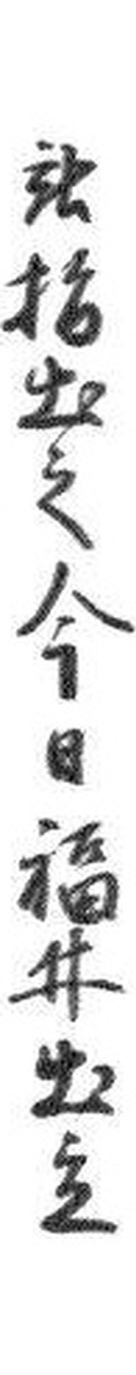被指出之今日福井出立
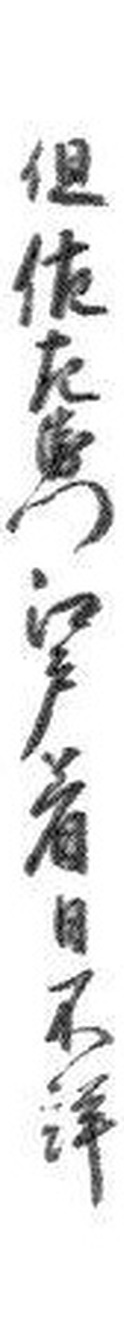但佐左衛門江戸着日不詳
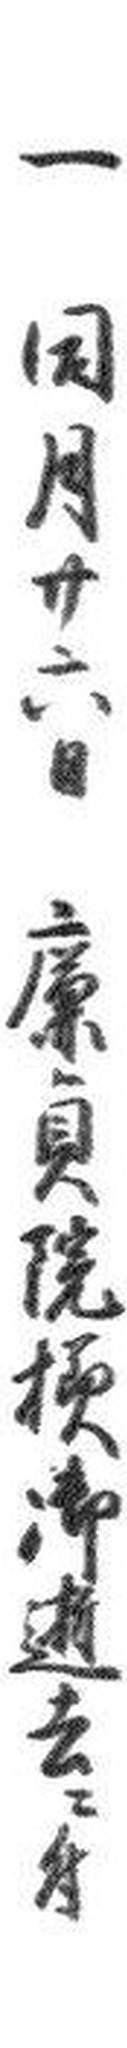一同月廿六日廉貞院様御逝去ニ付
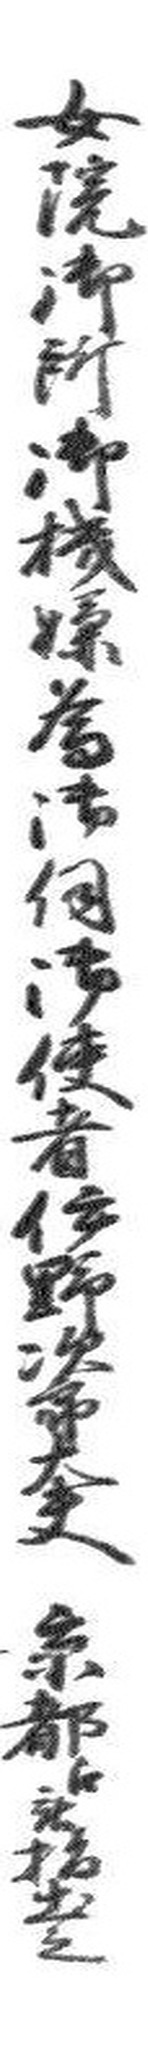女院御所御機嫌為御伺御使者伊野次郎大夫京都江被指出之
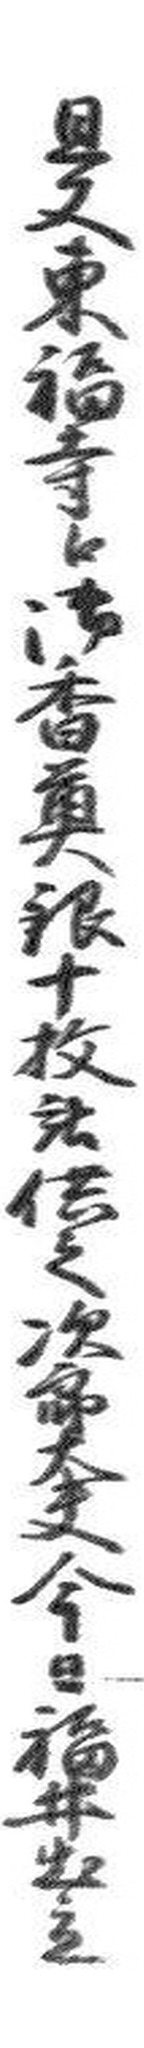且又東福寺江御香奠銀十枚被供之次郎大夫今日福井出立
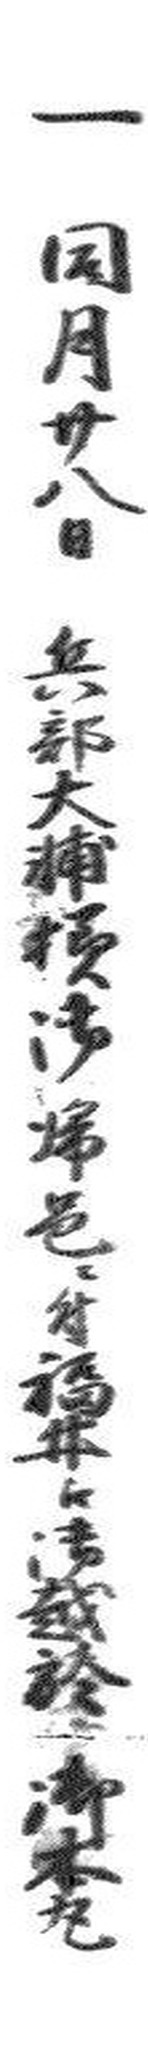一同月廿八日兵部大輔様御帰邑ニ付福井江御越於御本丸
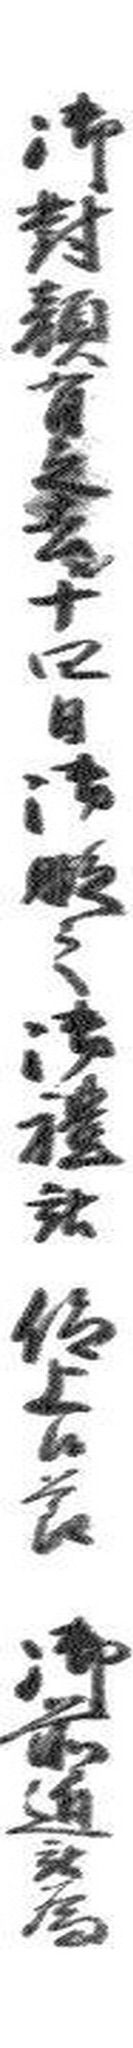御対顔有之去ル十四日御暇之御礼被仰上候節御前近被為
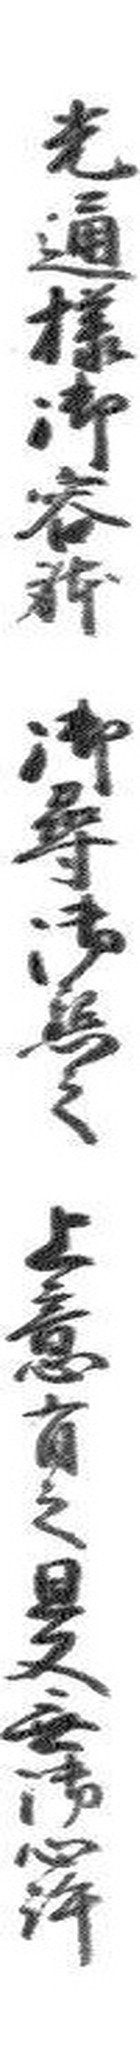光通様御容体御尋御懇之上意有之且又無御心許
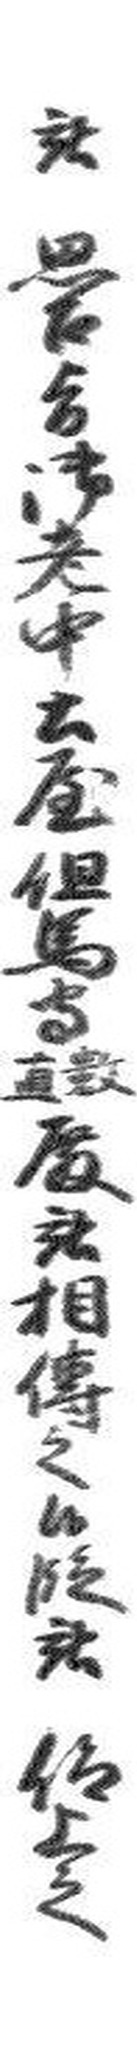被思召旨御老中土屋但馬守数直殿被相伝之候段被仰上之
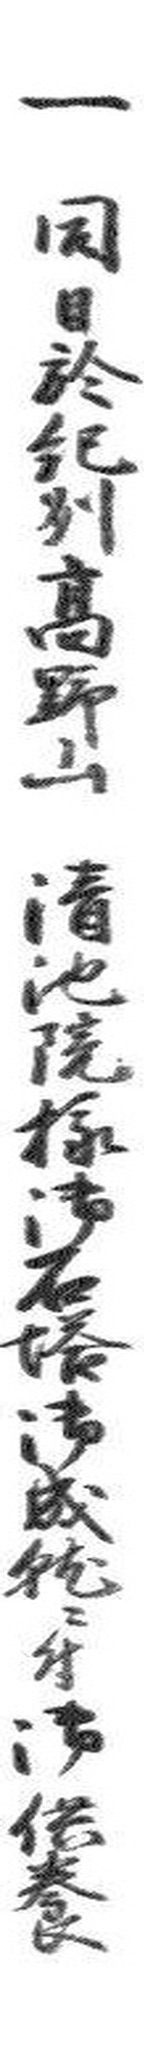一同日於紀州高野山清池院様御石塔御成就ニ付御供養

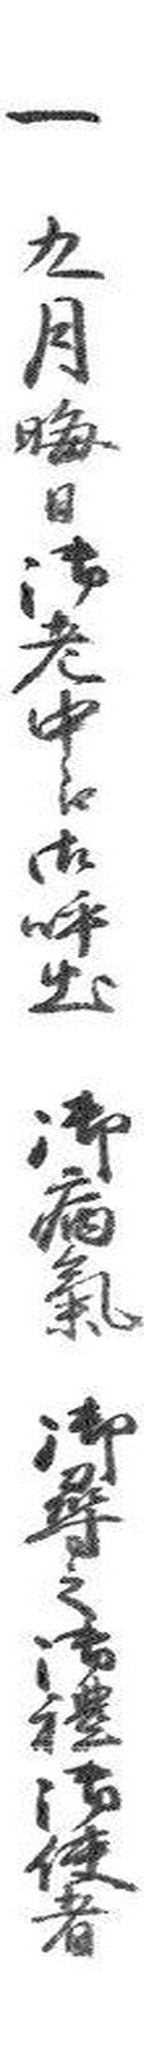一九月晦日御老中江御呼出御病気御尋之御礼御使者
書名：家譜 八 光通公 従寛文十年到同十二年
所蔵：福井県文書館 Fukui Prefectural Archives
